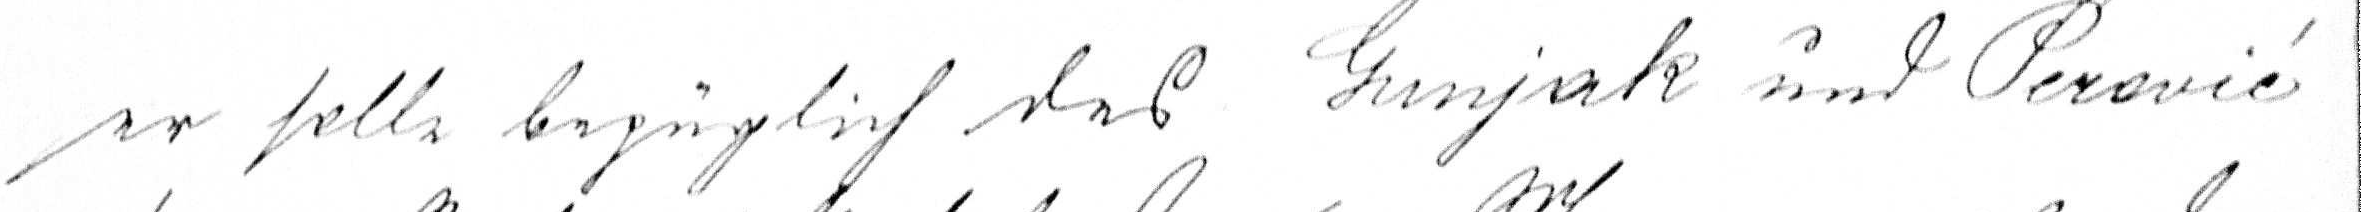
er solle bezüglich des Gunjak und Perović
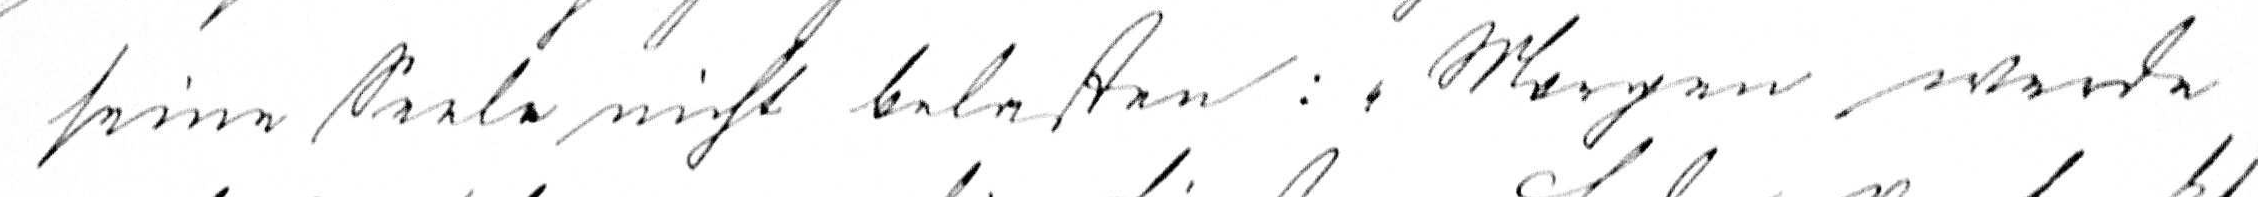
seine Seele nicht belasten: „Morgen werde
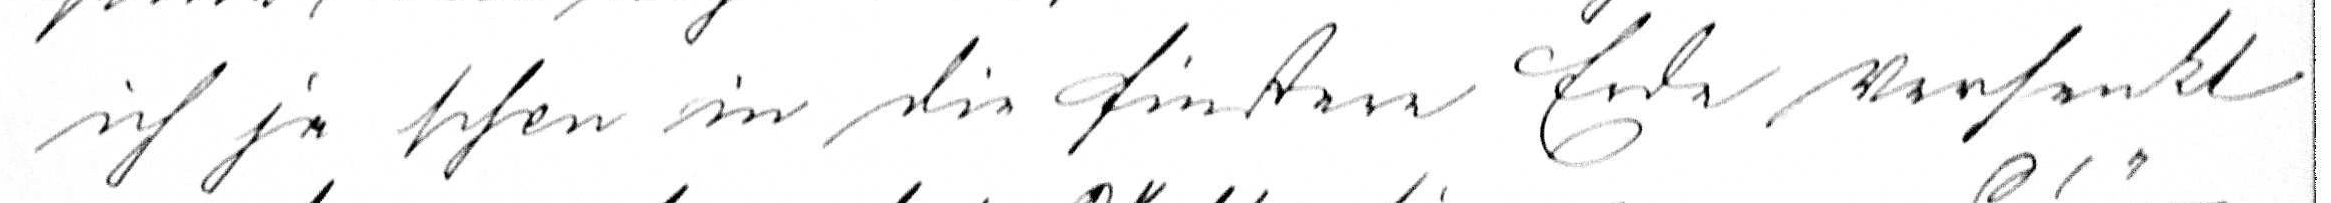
ich ja schon in die finstere Erde versenkt
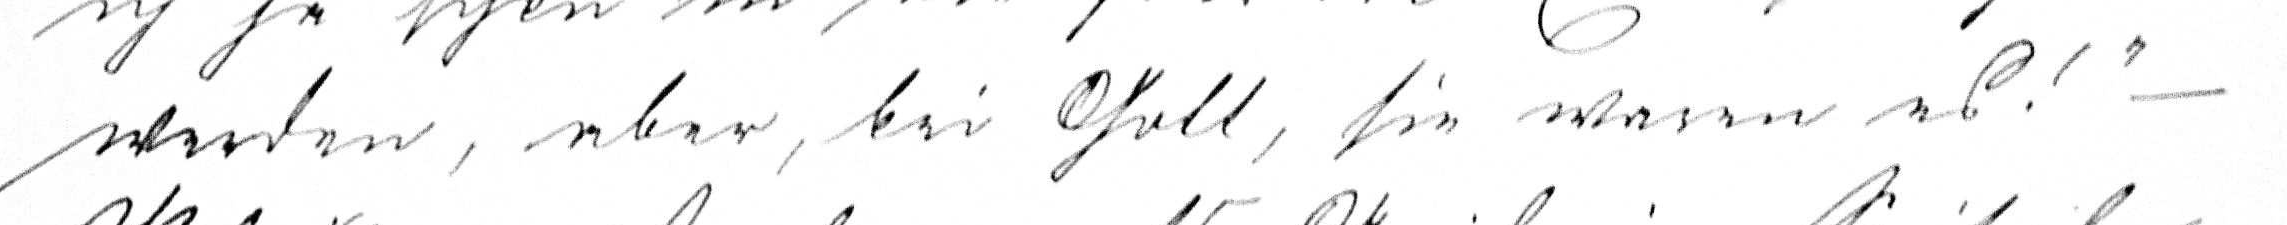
werden, aber, bei Gott, sie waren es!“–
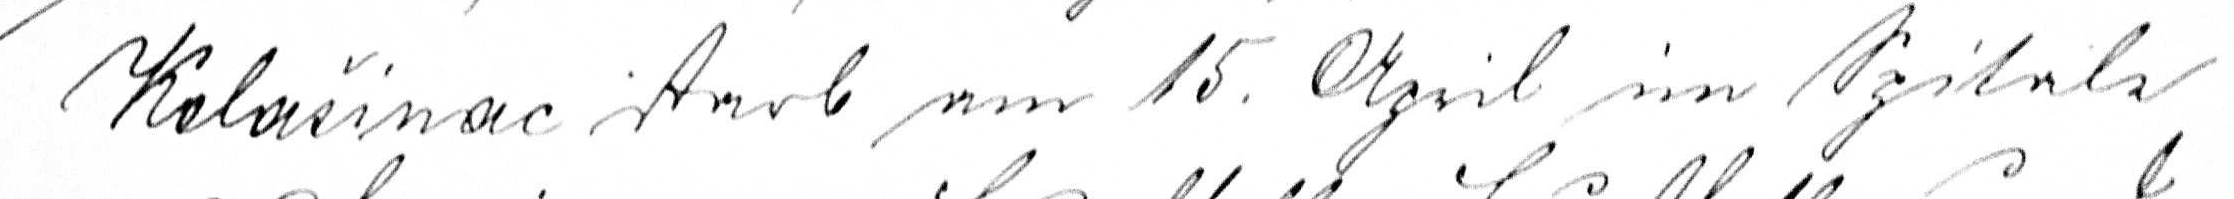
Kolašinac starb am 15. April im Spitale
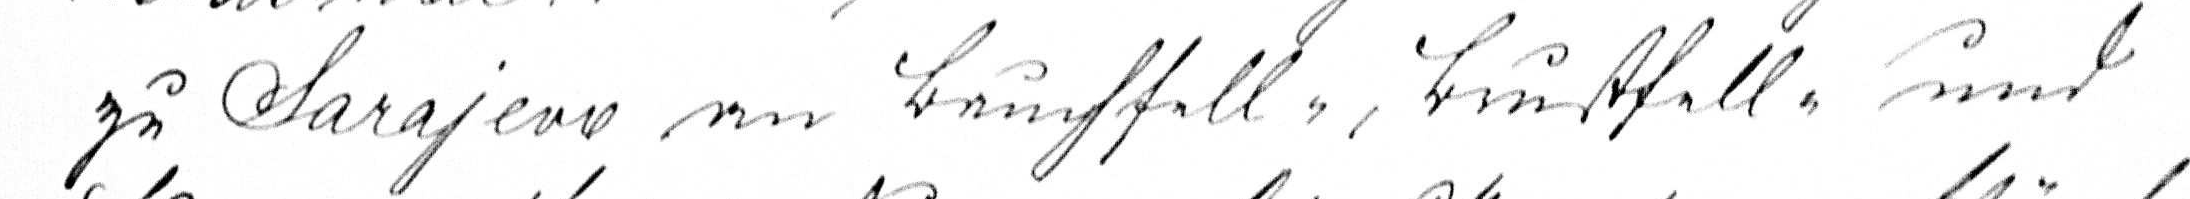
zu Sarajevo an Bauchfell-, Brustfell- und
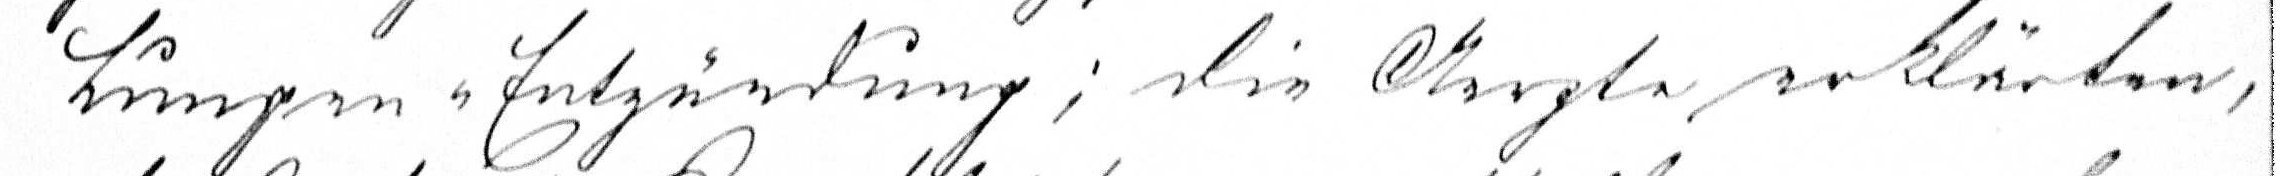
Lungen-Entzündung; die Aerzte erklärten,
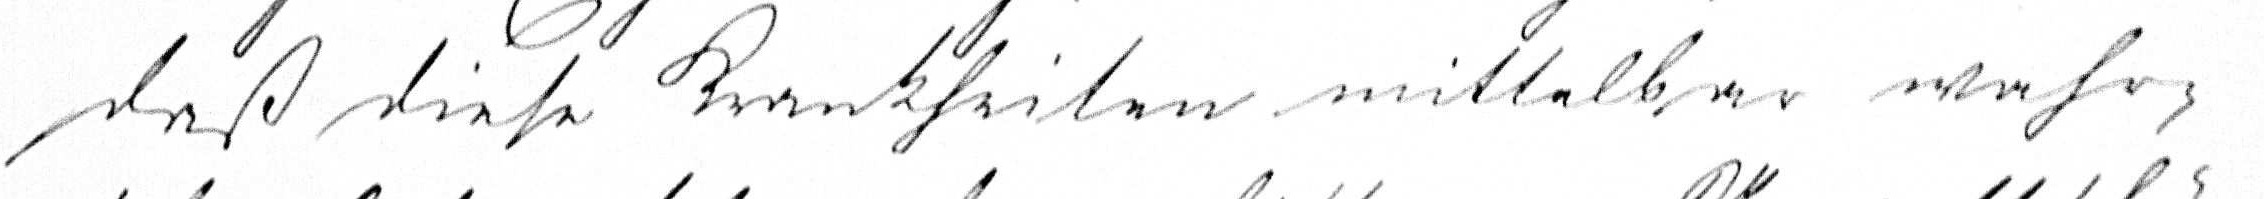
daß diese Krankheiten mittelbar wahr¬
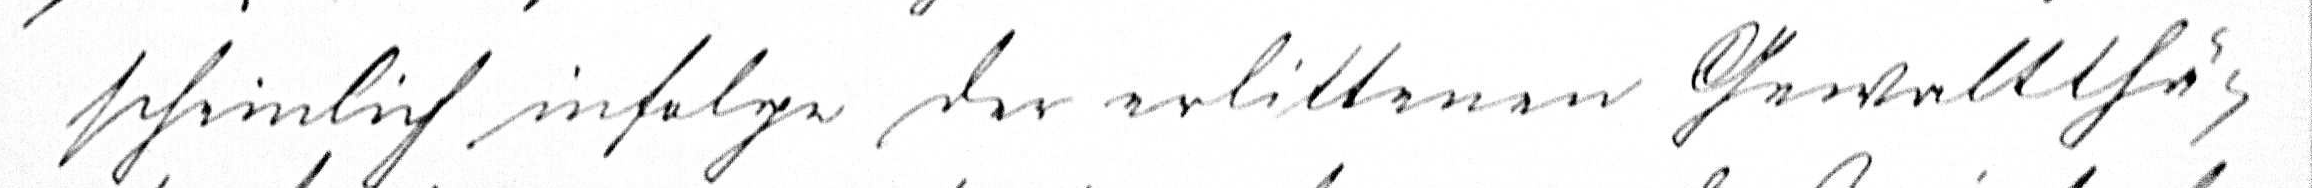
scheinlich infolge der erlittenen Gewaltthä¬
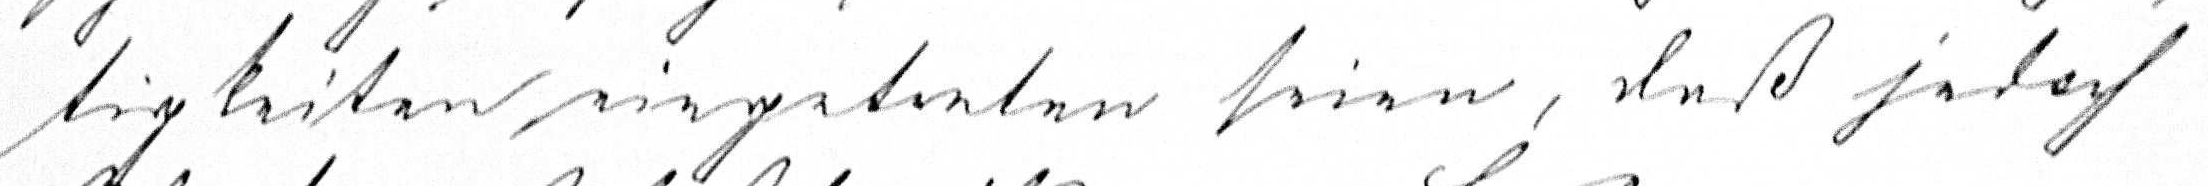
tigkeiten eingetreten seien, daß jedoch
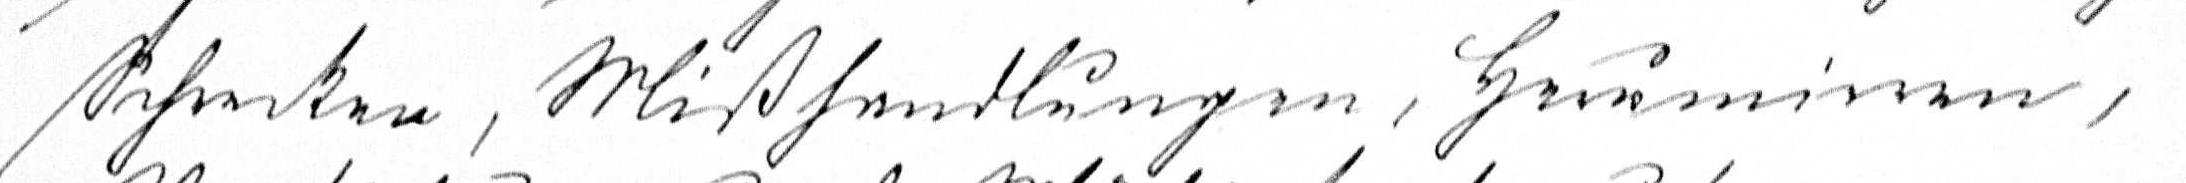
Schrecken, Mißhandlungen, Herumirren,
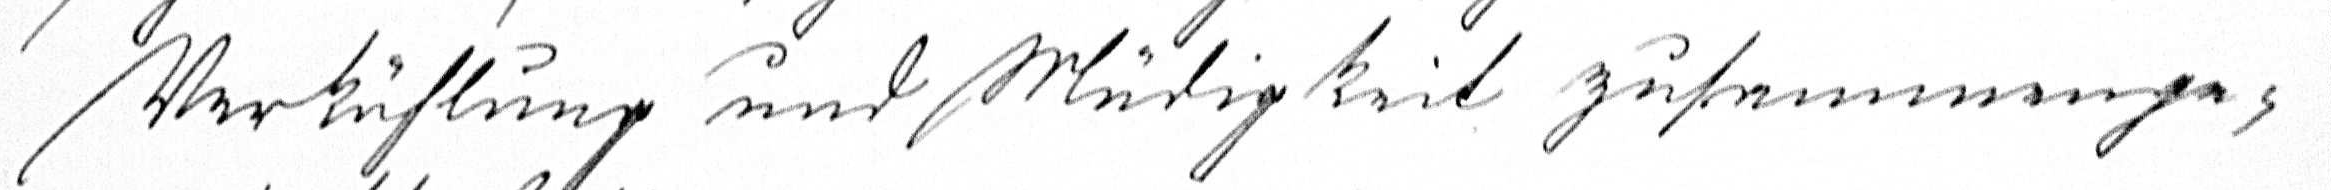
Verkühlung und Müdigkeit zusammenge¬
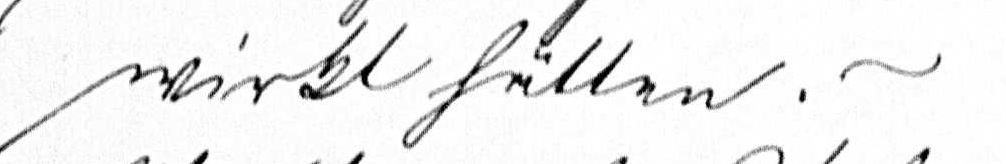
wirkt hätten.
